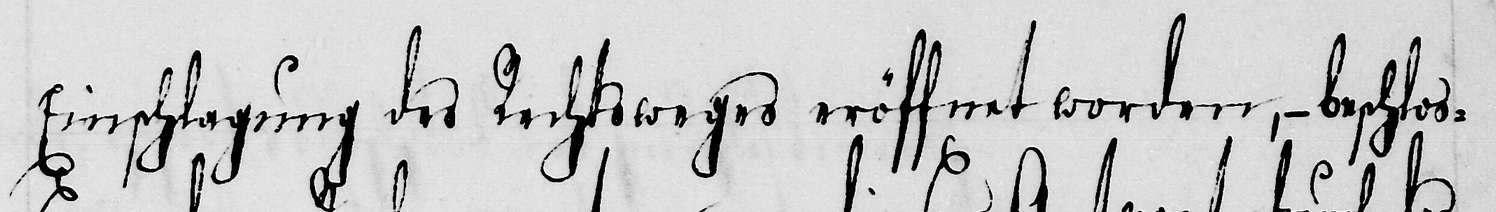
Einschlagung des Rechtsweges eröffnet worden, – beschlo¬
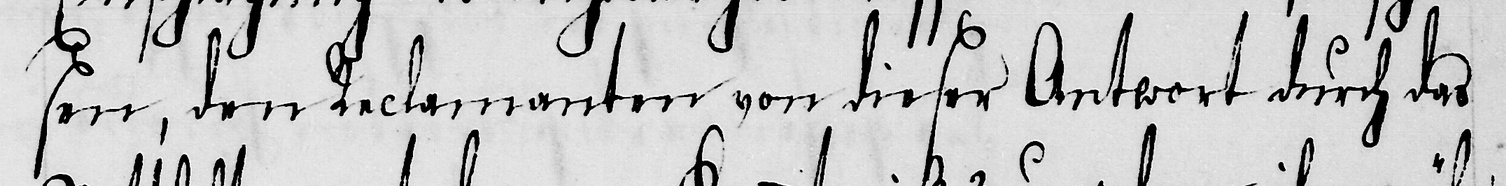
ßen, den Reclamanten von dieser Antwort durch das
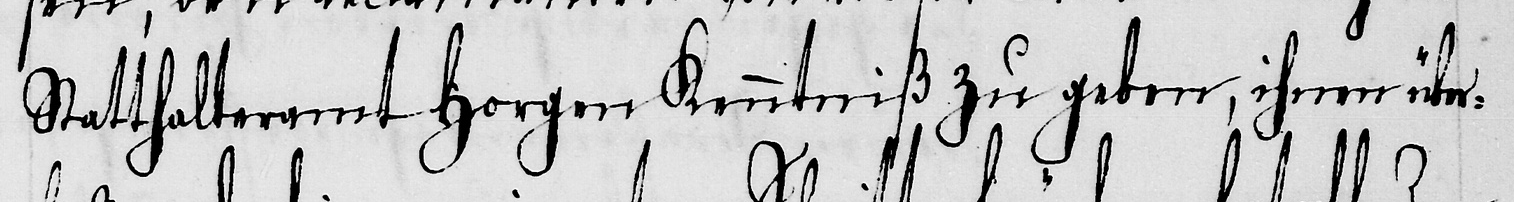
Statthalteramt Horgen Kenntniß zu geben, ihnen über¬
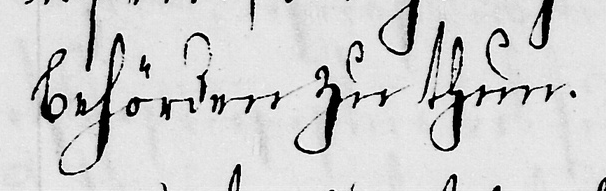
Behörden zu thun.
